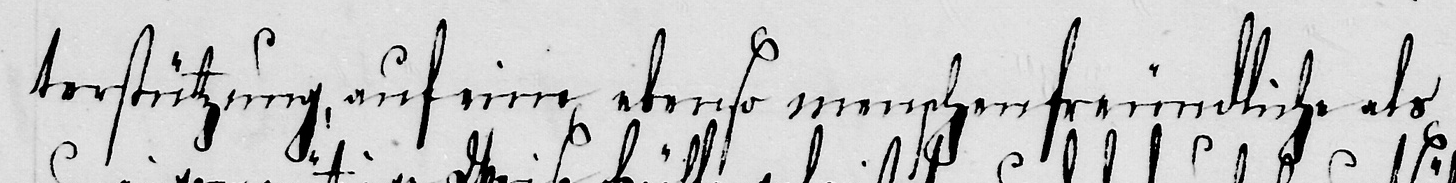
terstützung, auf eine ebenso menschenfreundliche als
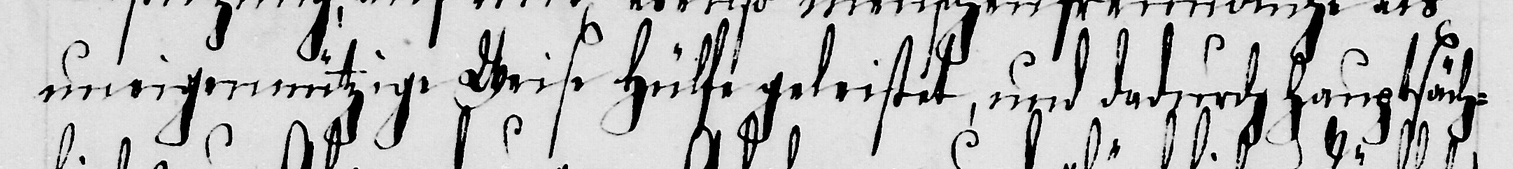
eigennützige Weise Hülfe geleistet, und dadurch hauptsä¬
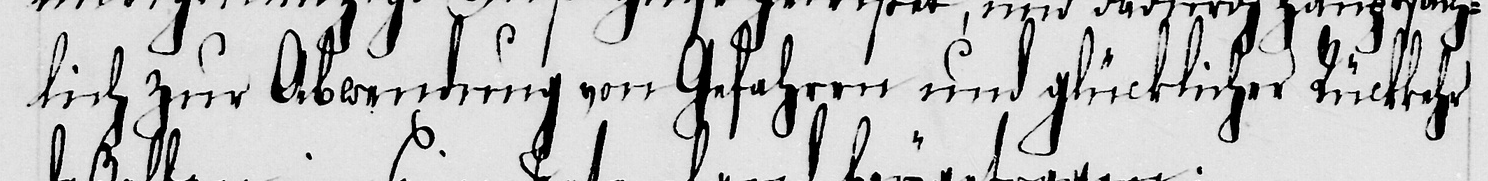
lich zur Abwendung von Gefahren und glücklicher Rückkehr
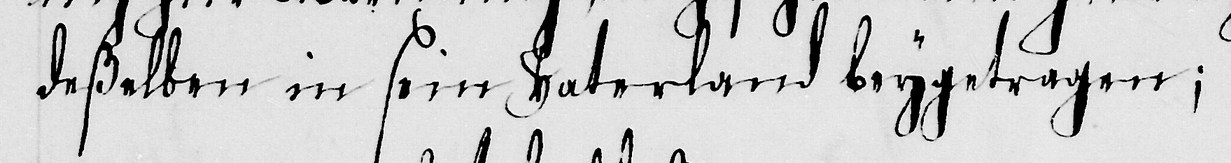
deßelben in sein Vaterland beygetragen;
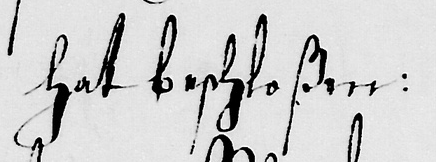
hat beschloßen:
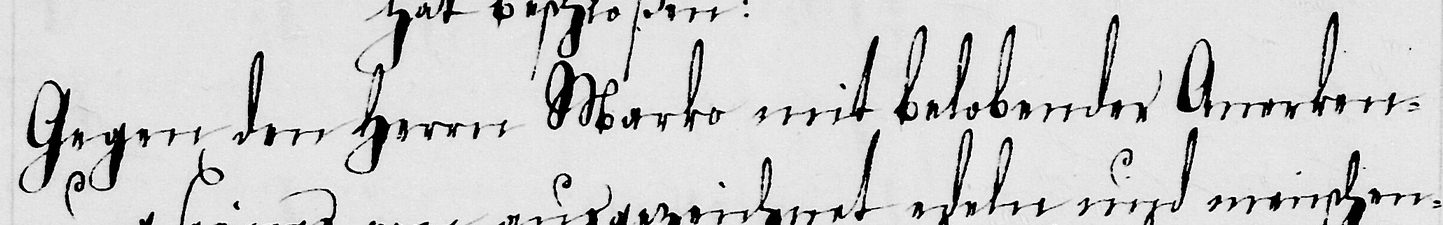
Gegen den Herrn Marko mit belobender Anerken¬
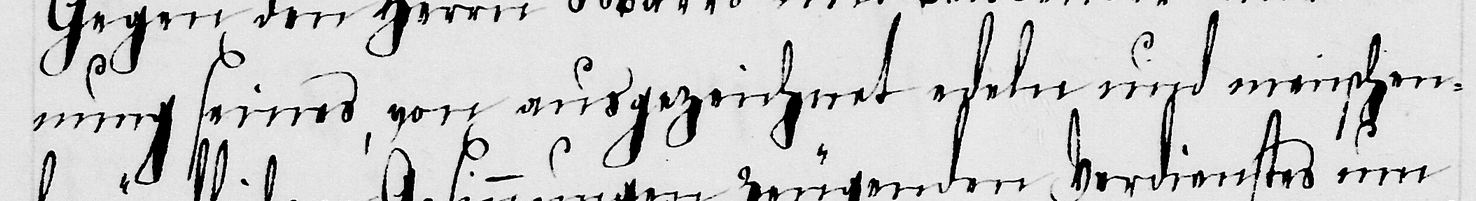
nung seines, von ausgezeichnet edlen und menschen¬
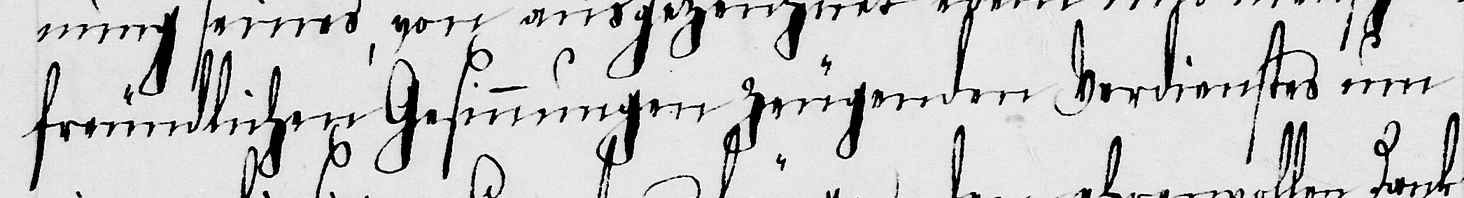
freundlichen Gesinnungen zeugenden Verdienstes um
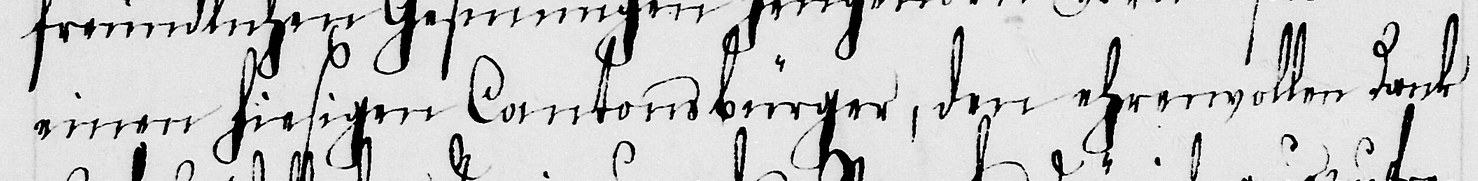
einen hiesigen Cantonsbürger, den ehrenvollen Dank
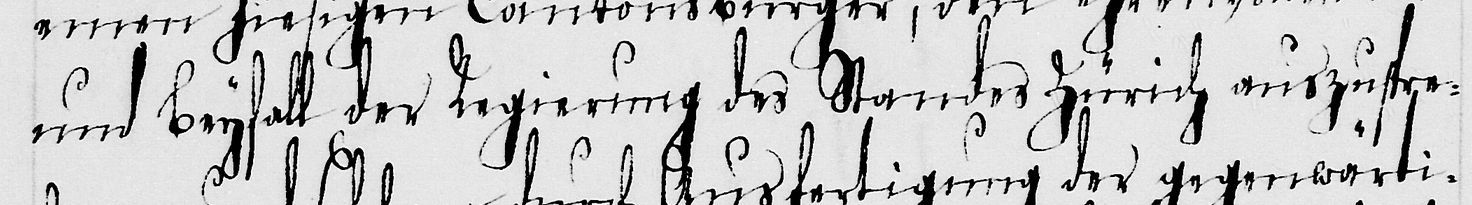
und Beyfall der Regierung des Standes Zürich auszuspre¬
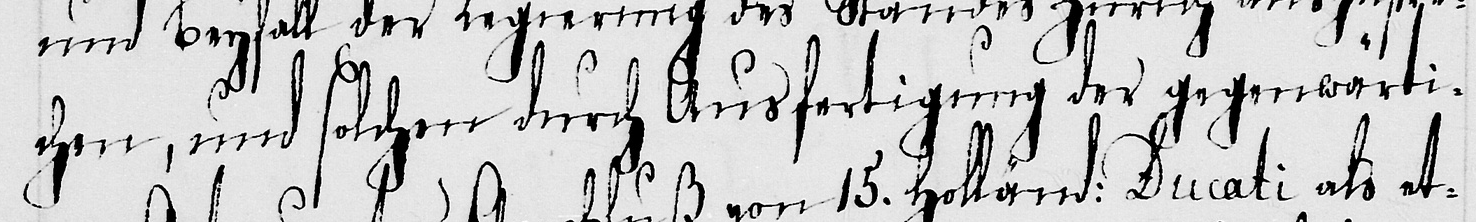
chen, und solchen durch Ausfertigung der gegenwärti¬
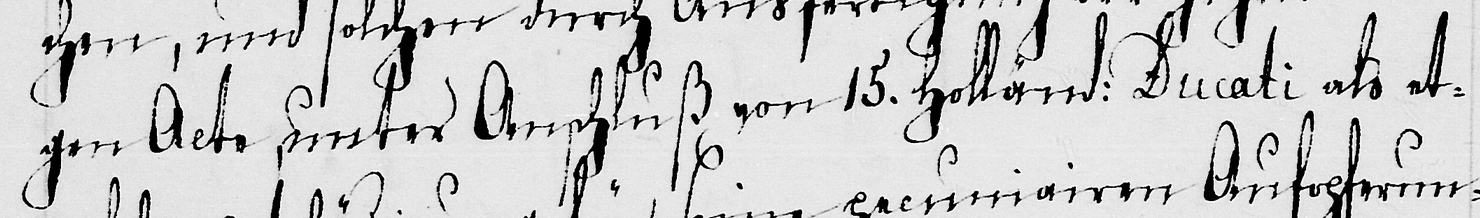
gen Acte, unter Anschluß von 15. Holländ. Ducati als et¬
